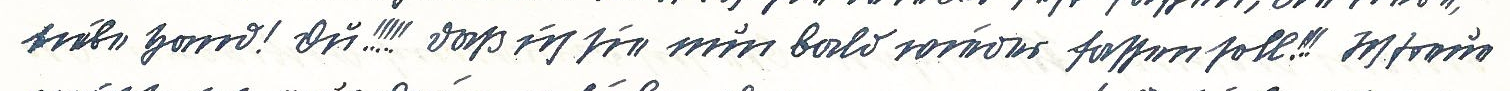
siebe hand! Du!!!!! Daß ich sie nun bald wieder fassen soll!!! Ich freue
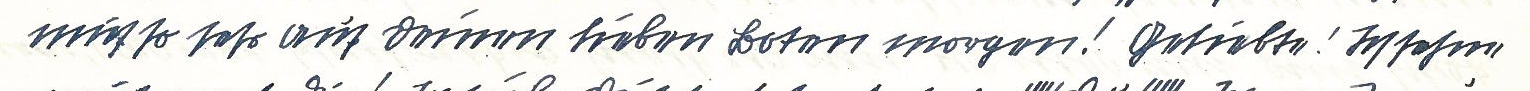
mich so sehr auf Deinen lieben Boten morgen! Geliebte! Ich sehne
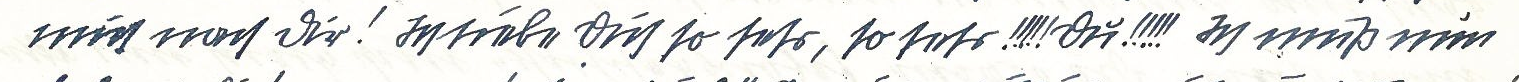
mich nach Dir! Ich liebe Dich so sehr, so sehr!!!!! Du!!!!! Ich muß nun
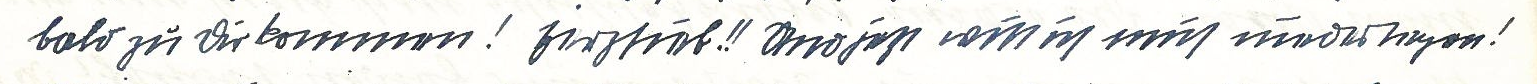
bald zu Dir kommen! Herzlieb!! Und jetzt will ich mich niederlegen!
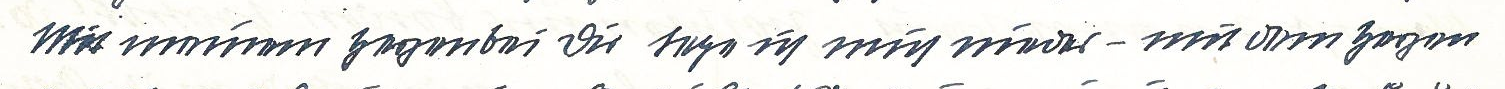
Mit meinem Herzen bei Dir lege ich mich nieder – mit dem Herzen
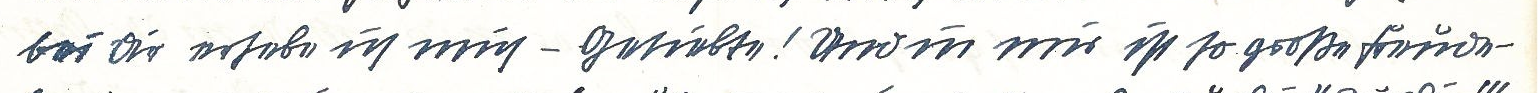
bei Dir erhebe ich mich – Geliebte! Und in mir ist so große Freude –
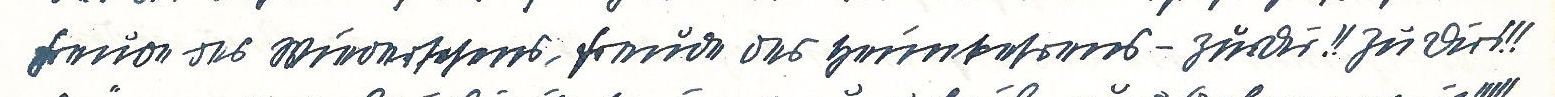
Freude des Wiedersehens, Freude des Heimkehrens – zu Dir!! Zu Dir!!!
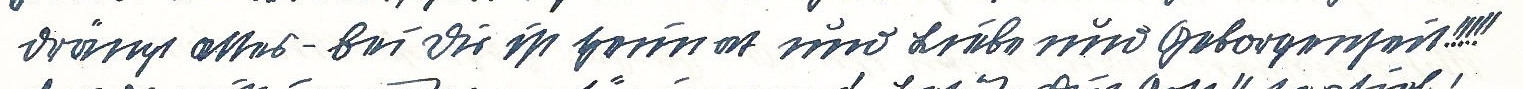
Drängt alles – bei Dir ist Heimat und Liebe und Geborgenheit!!!!!
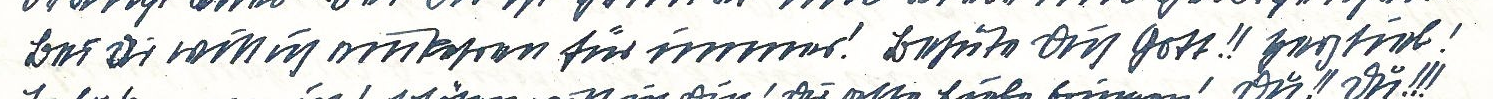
Bei Dir will ich einkehren für immer! Behüte Dich Gott!! Herzlieb!
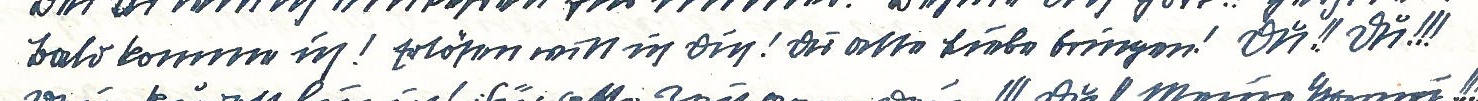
Bald komme ich! Erlösen will ich Dich! Dir alle Liebe bringen! Du!! Du!!!
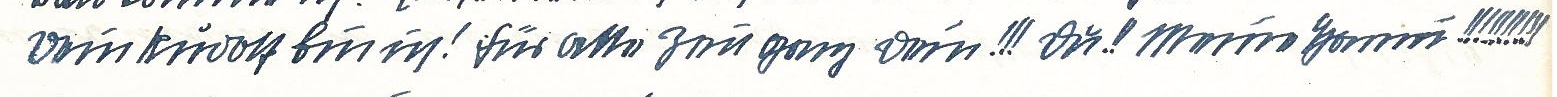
Dein [Roland] bin ich! Für alle Zeit ganz Dein!!! Du!! Meine!!!!!!!!!!
